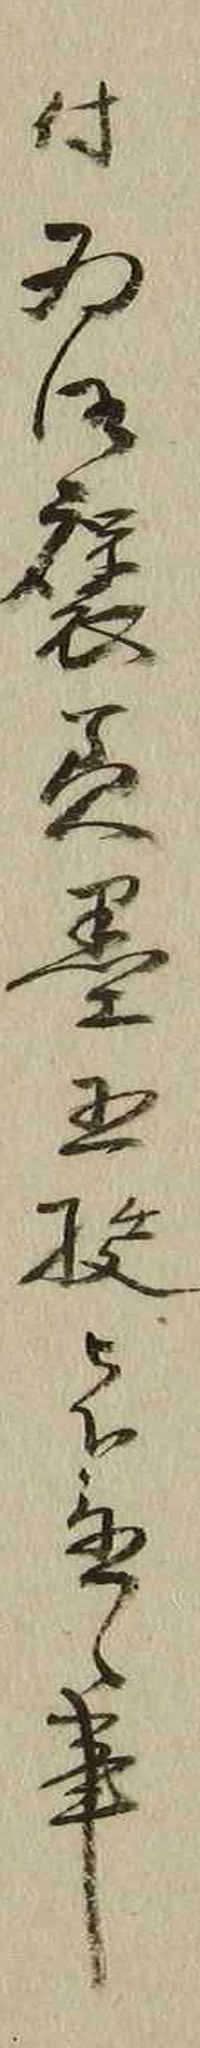付為御褒美墨五挺被下置候事
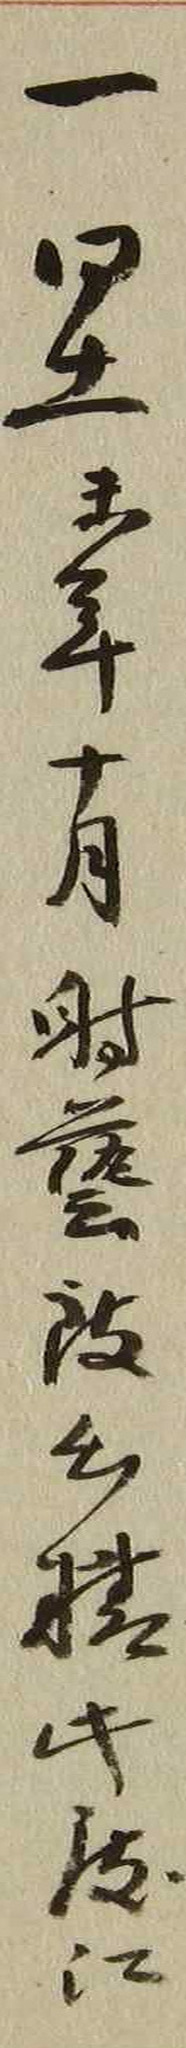一同十一未年十月射芸致出精此度江
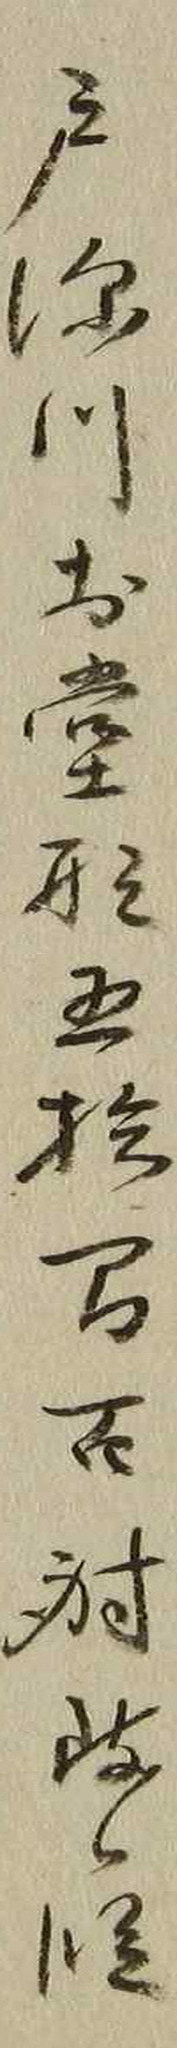戸深川於堂形五拾間百射致候段
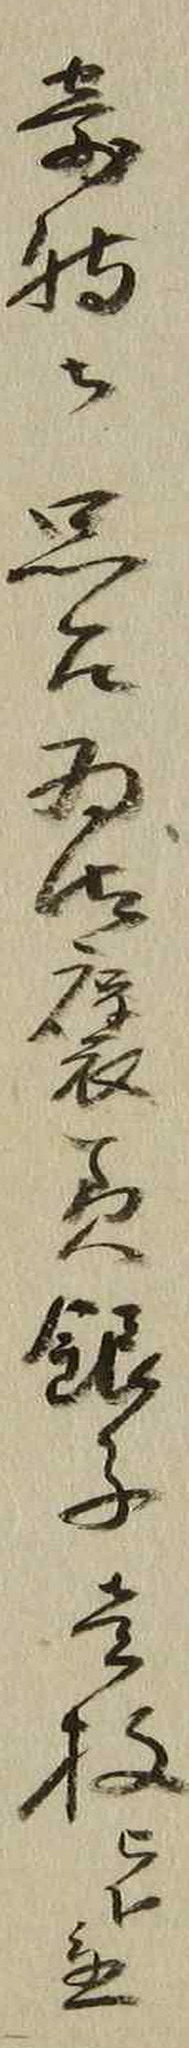奇特被思召為御褒美銀子壱枚被下置
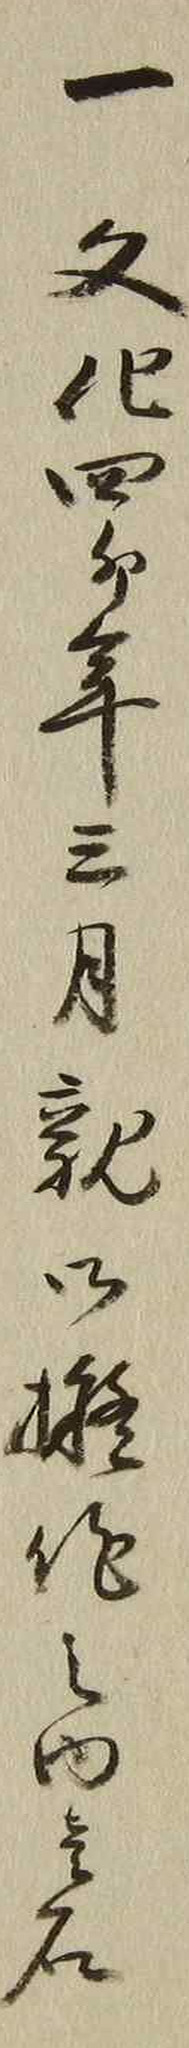一文化四卯年三月親御擬作之内壱石
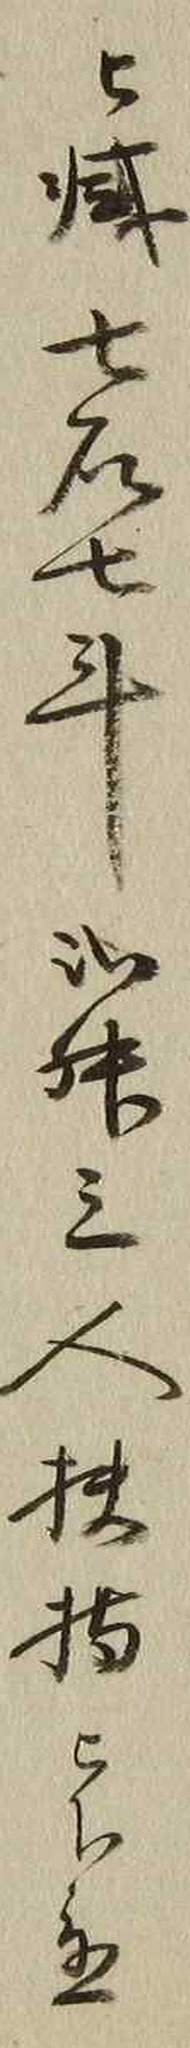被減七石七斗弐升三人扶持被下置
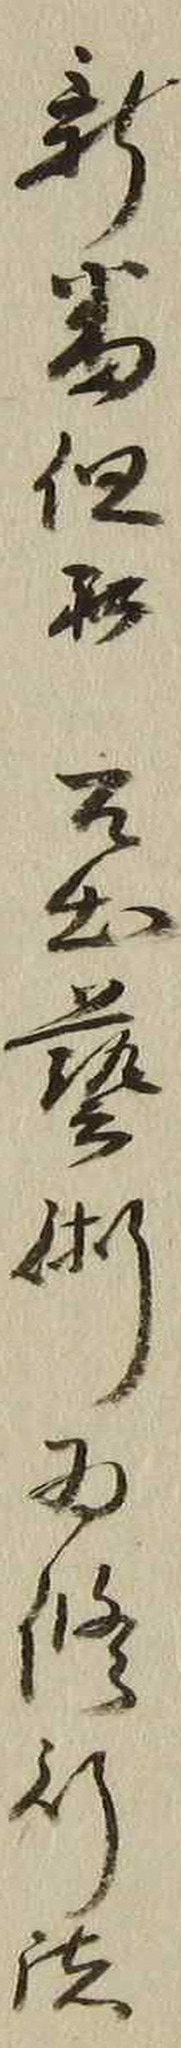新番組被召出芸術為修行諸
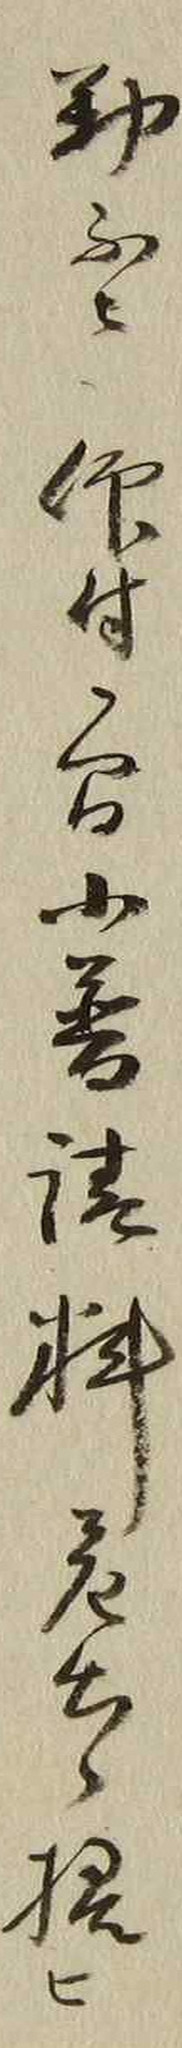勤不被仰付候間小普請料差出候様被
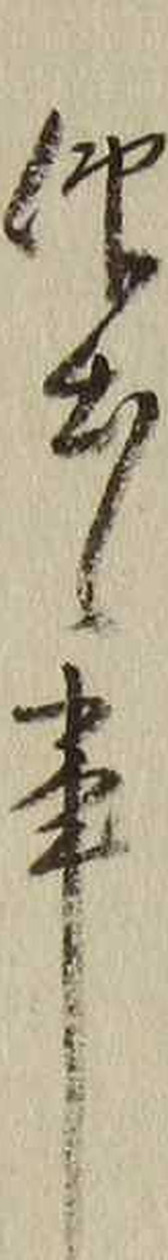仰出候事
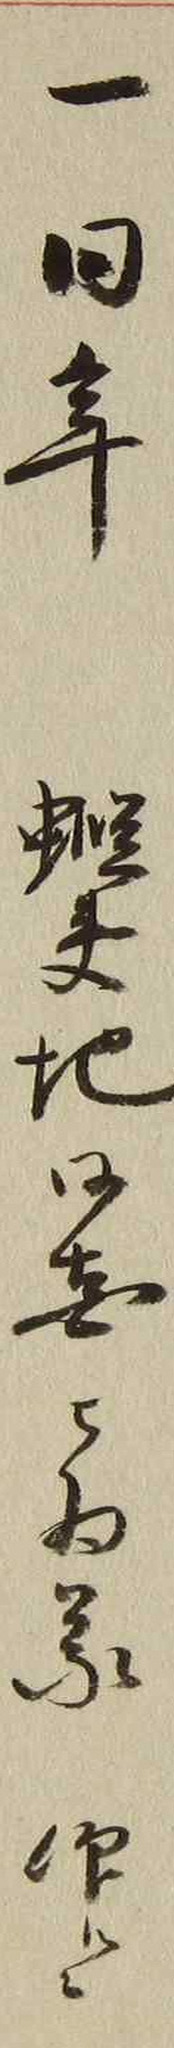一同年蝦夷地御固被為蒙仰候ニ
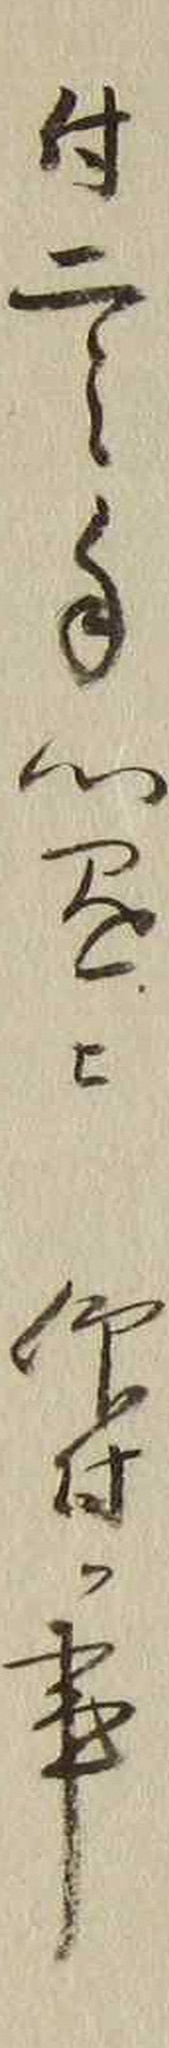付二之手心懸被仰付候事
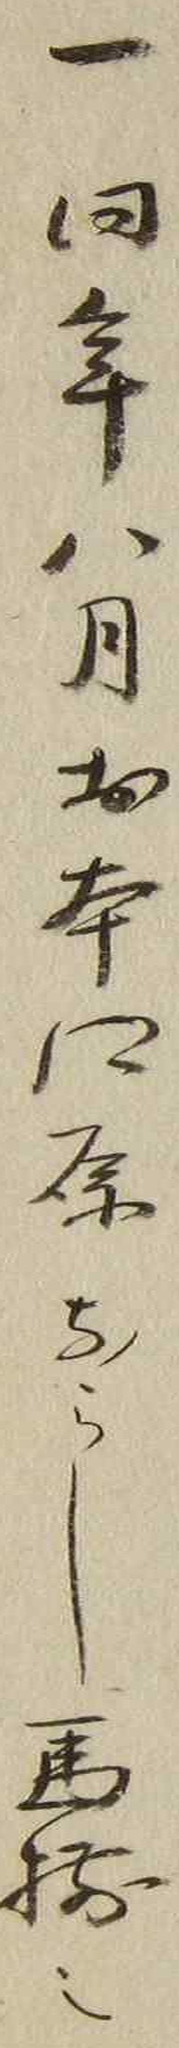一同年八月於本郷原ならし馬揃之
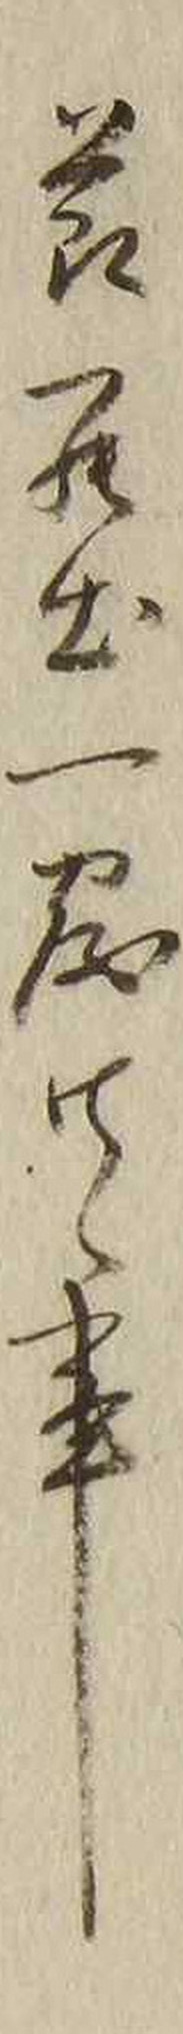節罷出一宿仕候事

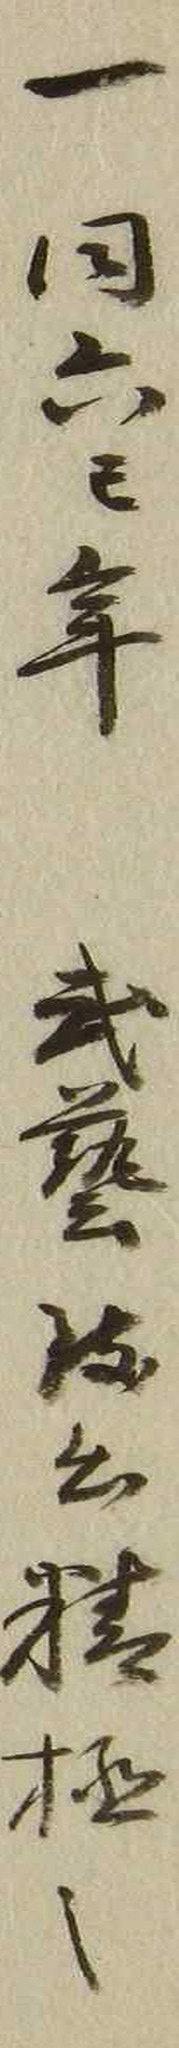一同六巳年武芸致出精極之
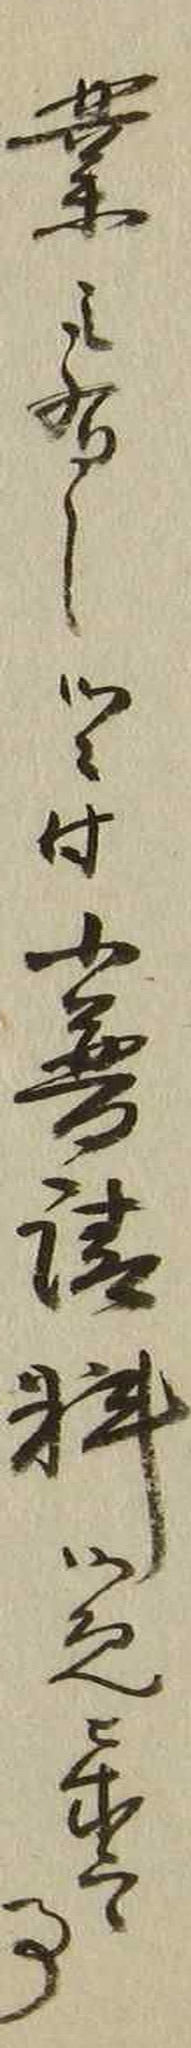業も有之候ニ付小普請料御免被成下候事
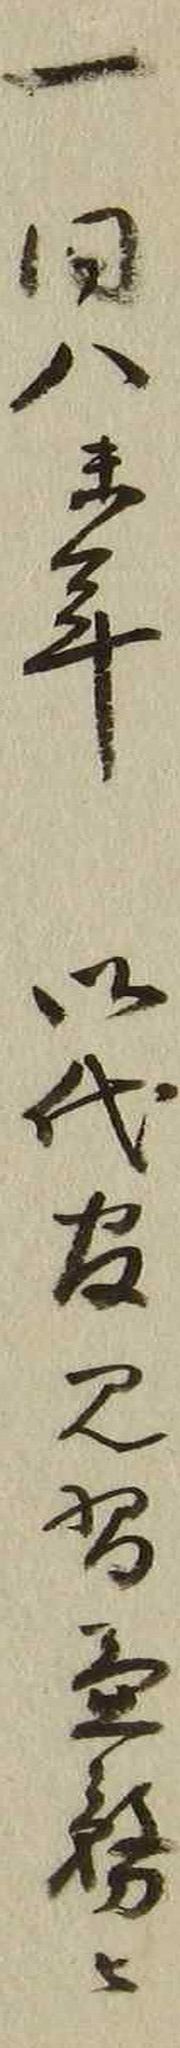一同八未年御代官見習兼務被
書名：諸士系譜　巻之236　ふ之部4
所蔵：会津若松市立会津図書館
